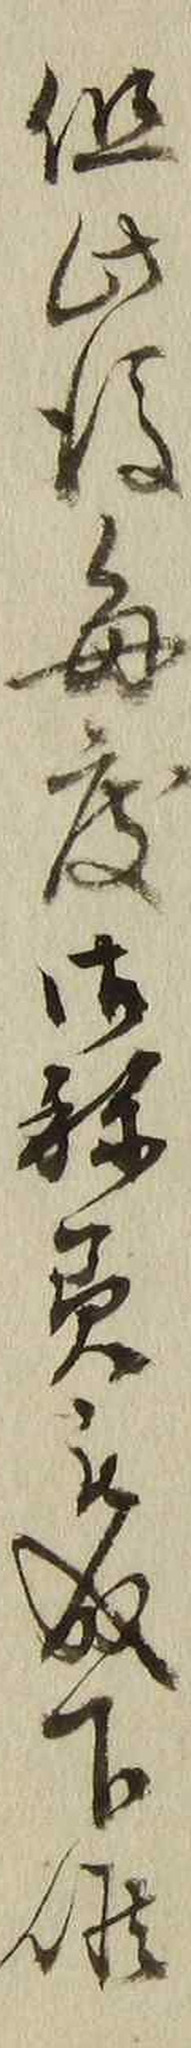但此後毎度御称美被成下候
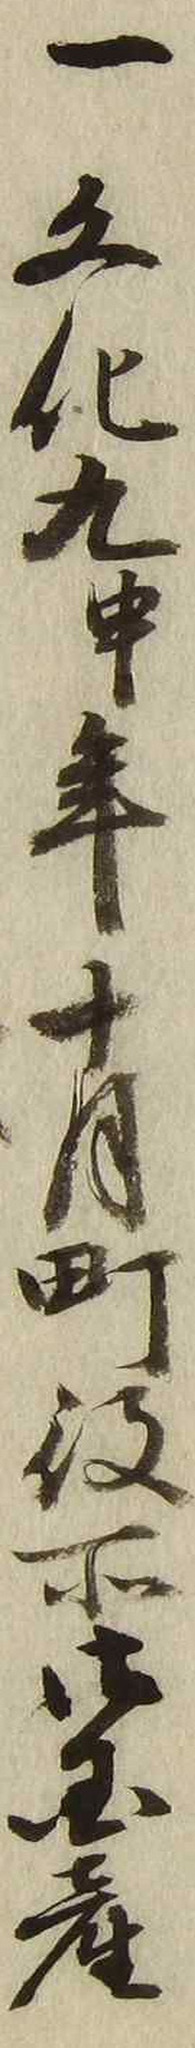一文化九申年十月町役所御国産
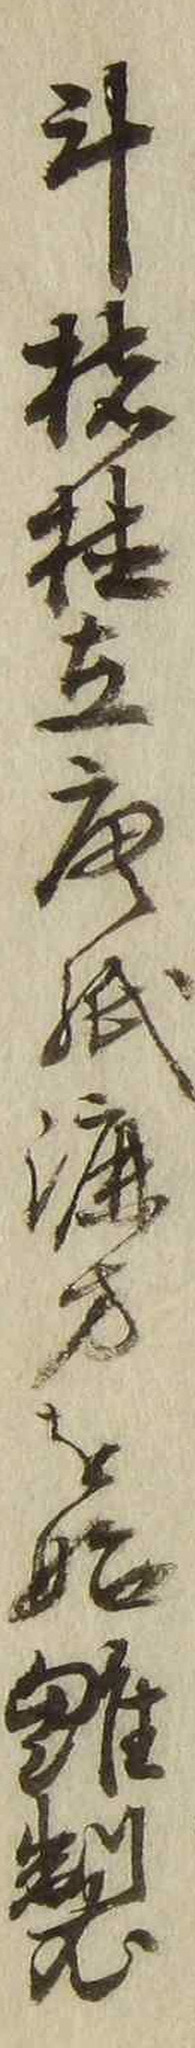斗指植立庵紙漉方を始雛製

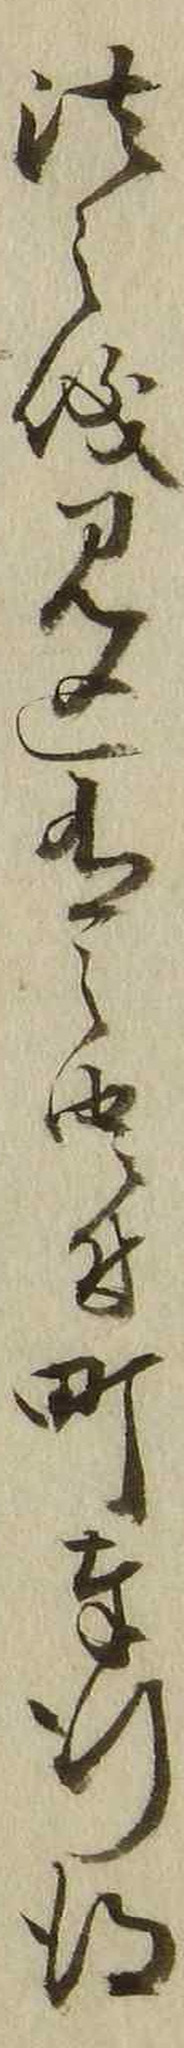法之儀見込有之由ニ付町奉行得
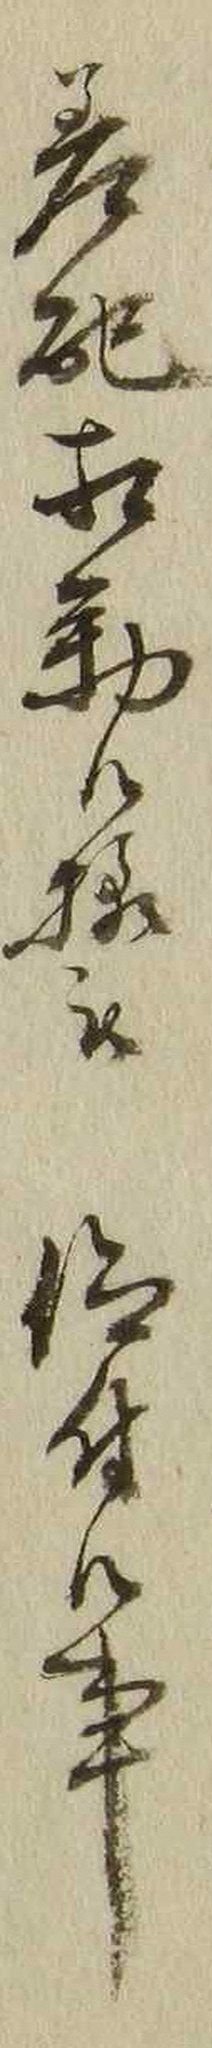差配相勤候様被仰付候事
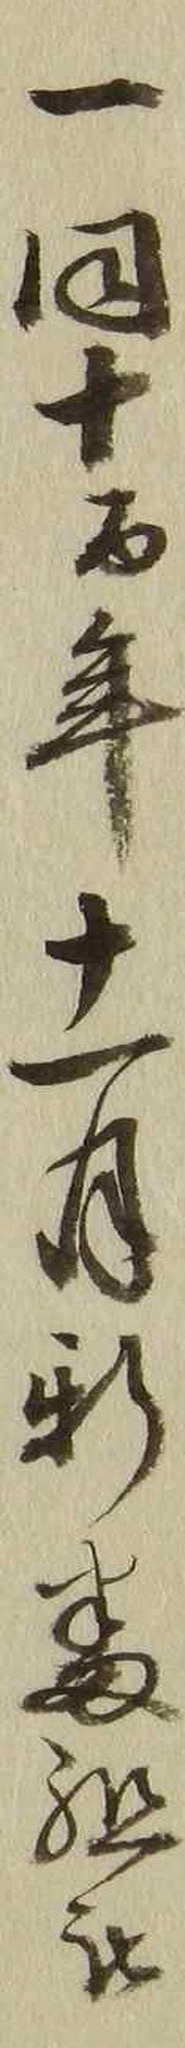一同十酉年十一月新番組被
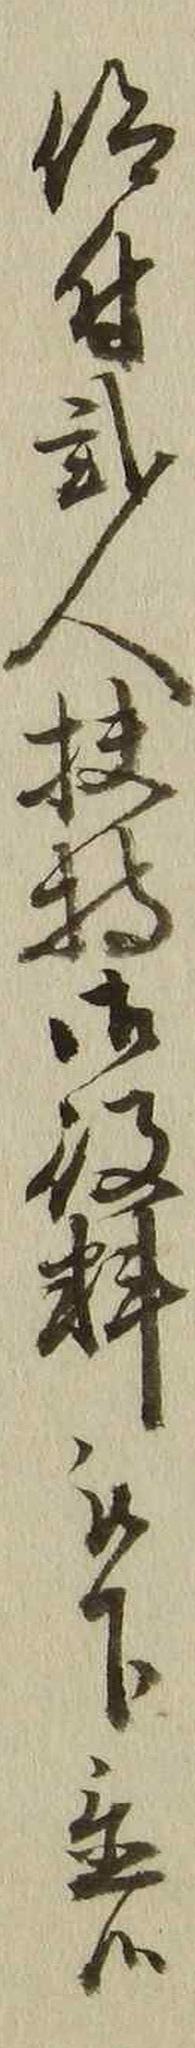仰付弐人扶持御役料被下置候
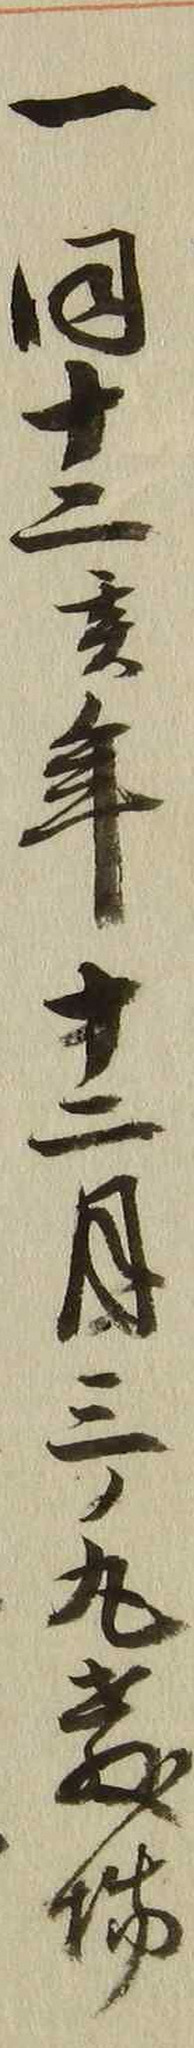一同十二亥年十二月三ノ丸教場
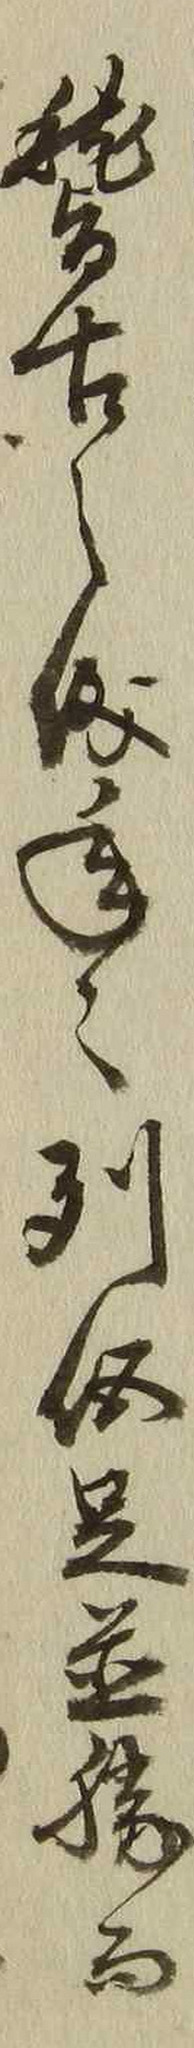稽古之儀年々列伍足並勝而
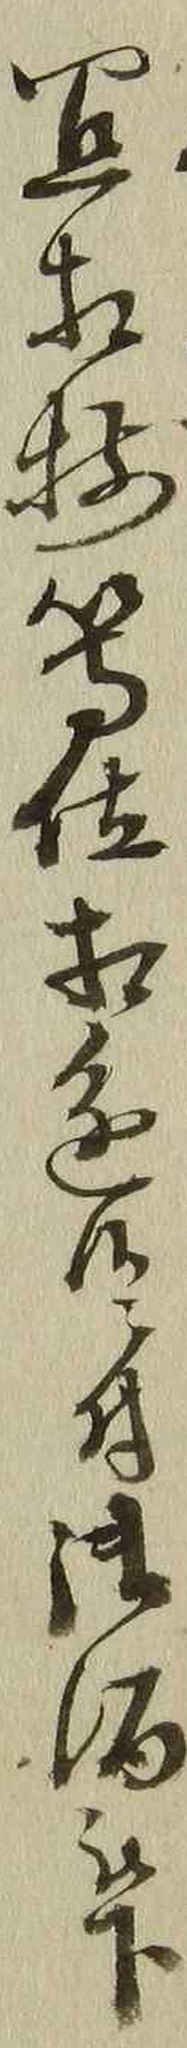宜相揃等位相進候ニ付御酒被下
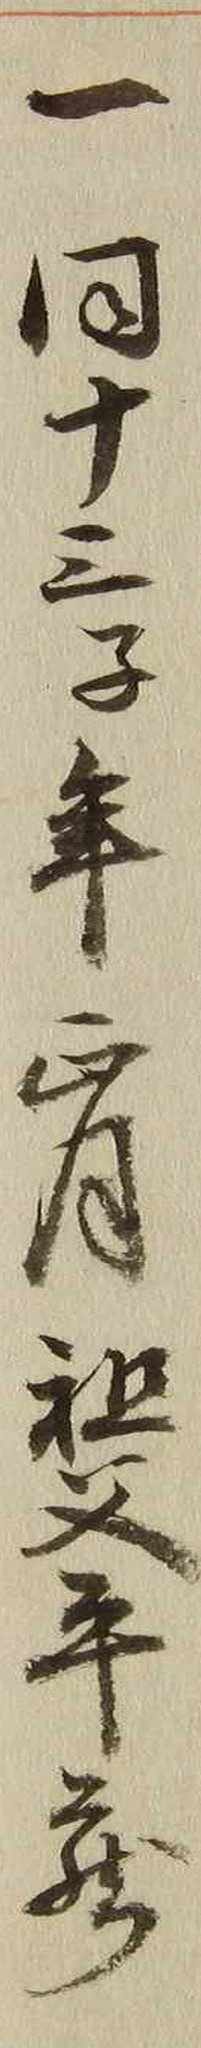一同十三子年正月祖父平藏
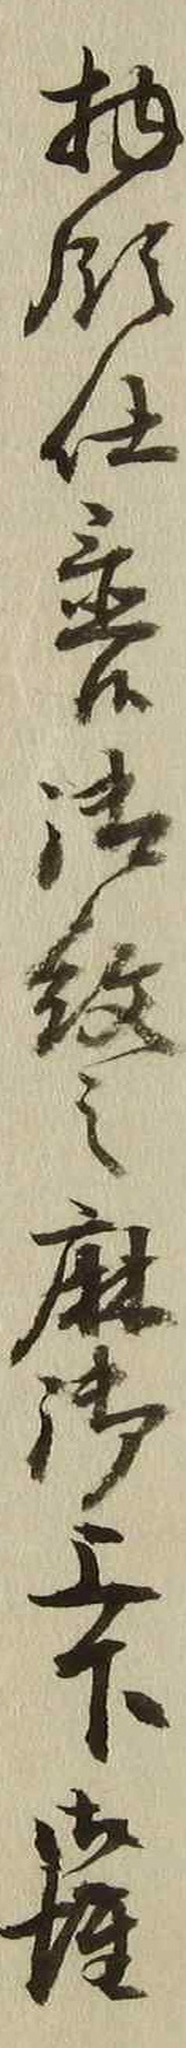拝領仕置候御紋之麻御上下御帷
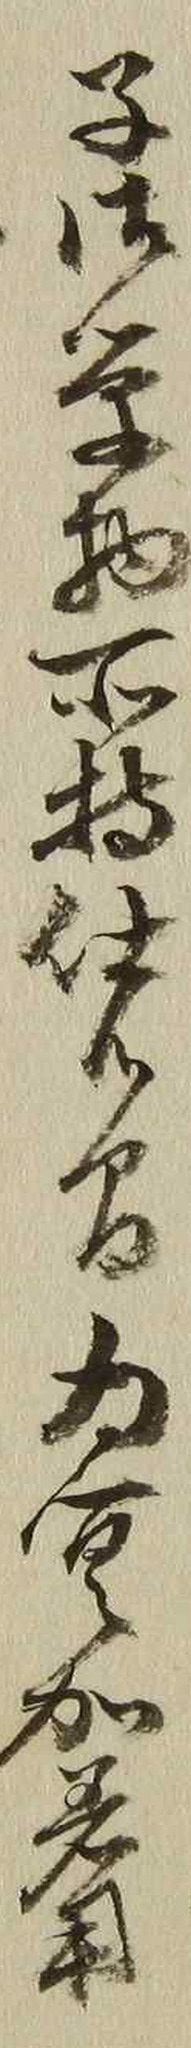子御単物所持仕候間為冥加着用
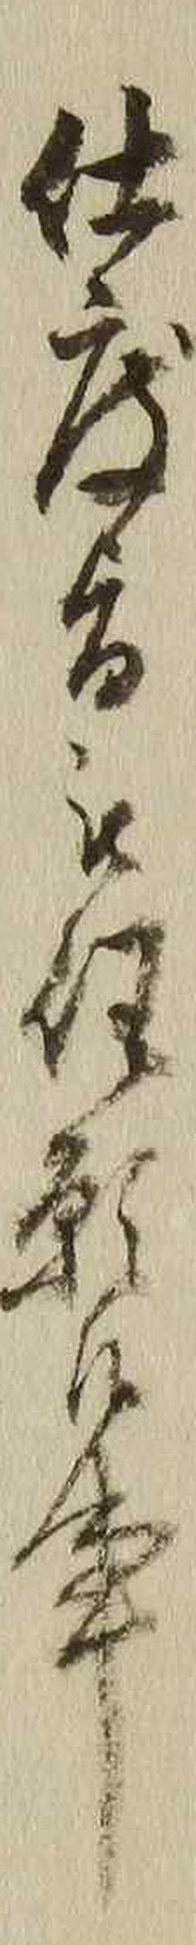仕度旨被任願候事
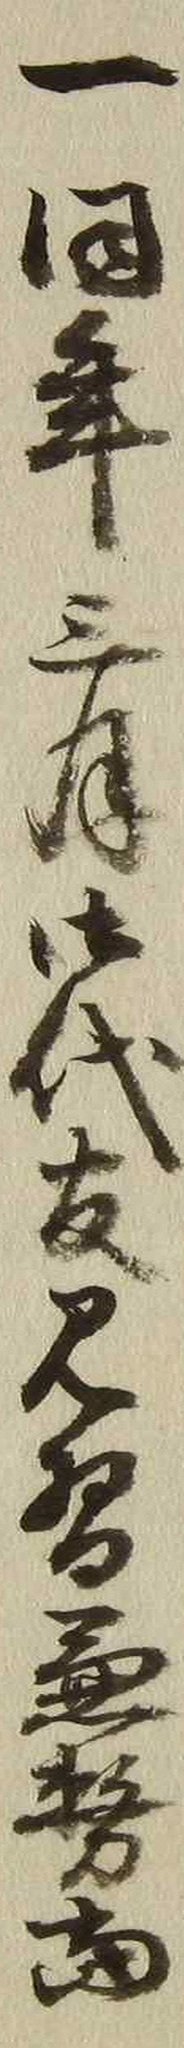一同年三月御代官見習兼務当
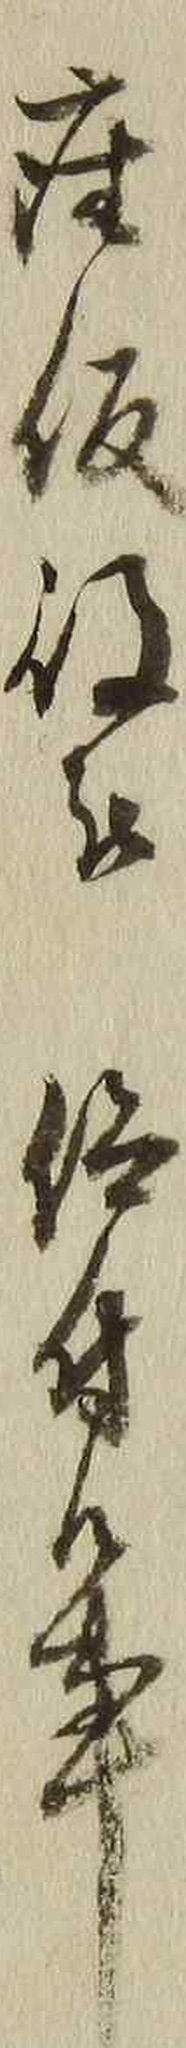座仮役被仰付候事
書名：諸士系譜　巻之64　と之部7
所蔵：会津若松市立会津図書館
